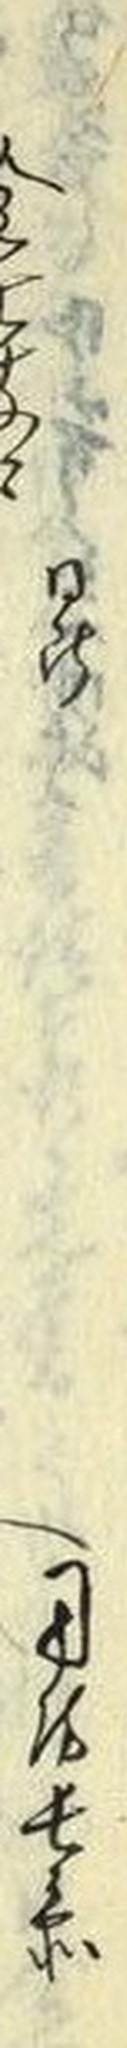金七両ツヽ同断周防長兵衛
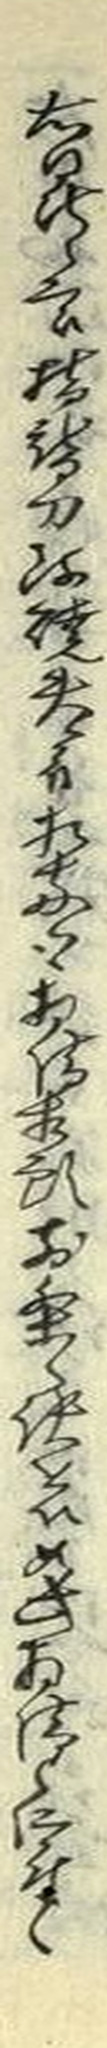右同断之節指替刀致焼失候ニ付拾両ツヽ拝借相願前条之訳を以如此拝借被仰付候
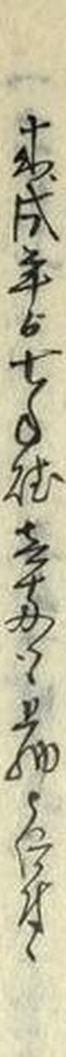来戌年ゟ七年賦壱両ツヽ上納被仰付候
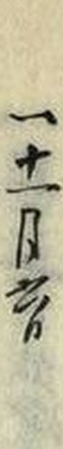一十一月六日
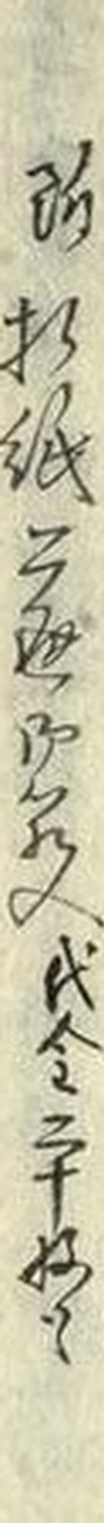附折紙二通御箱入代金二十枚ツヽ
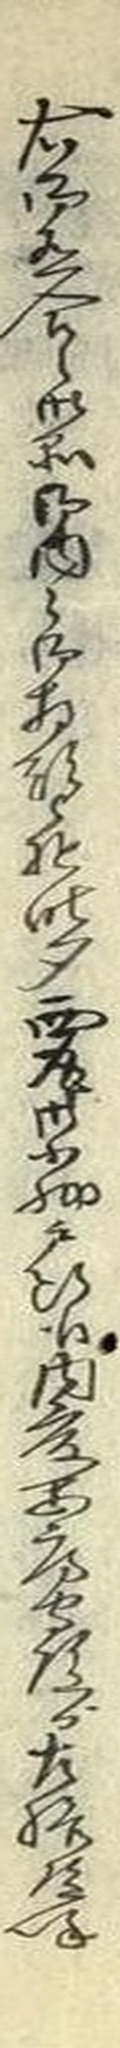右御有合之御品御内々御拝領被遊昨夕西丸御小納戸頭取内藤安房守殿ゟ左膳殿呼
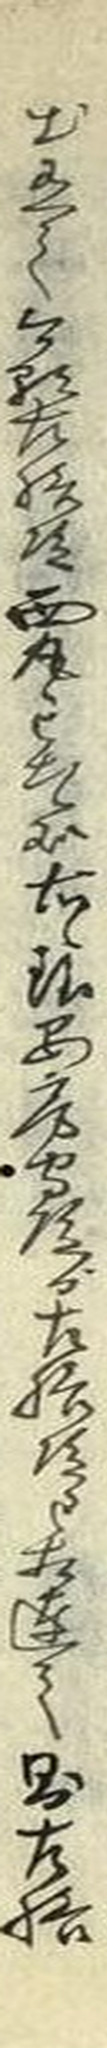出有之今朝左膳殿西丸へ被出候処右之趣安房守殿ゟ左膳殿へ被相達之則左膳
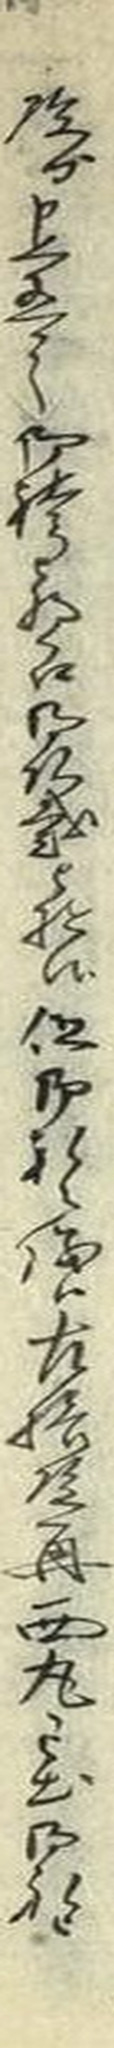殿ゟ申上有之御袴被為召御頂戴被遊候但御礼之儀ハ左膳殿再西丸へ被出御礼被
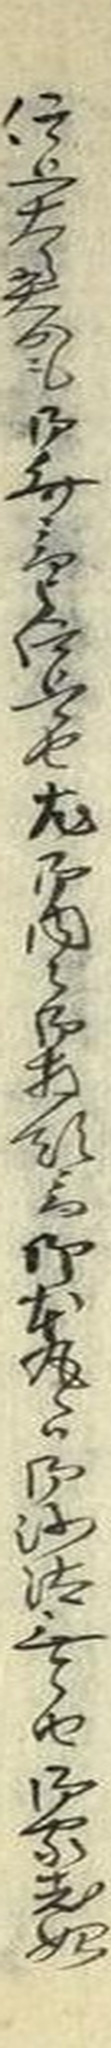仰上大奥ゟも御文ニ而被仰上候由尤御内々御拝領ニ而御本丸ヘハ御沙汰無候由御家老始
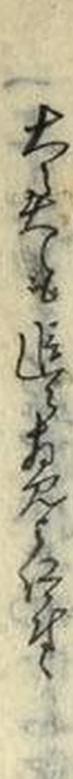大奥へも追々拝見被仰付候

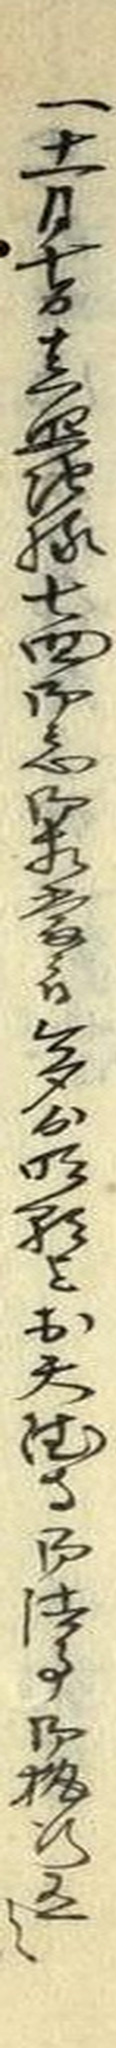一十一月七日真照院様七回御忌御相当ニ付今夕ゟ明朝迄於天徳寺御法事御執行有之
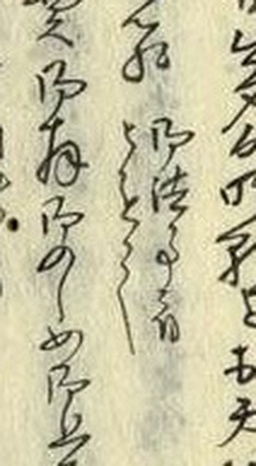被進之
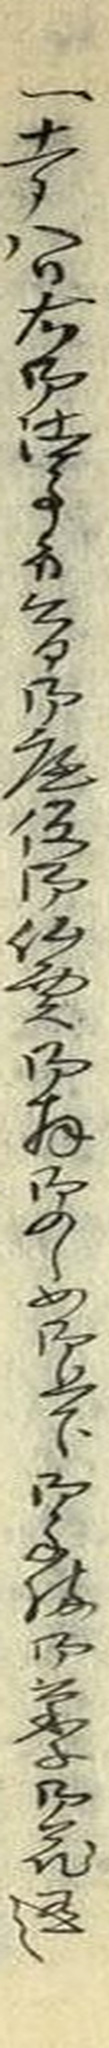一十一月八日右御法事ニ付今日御庭仮御仏殿御拝御のしめ御上下御手備御菓子御花有之
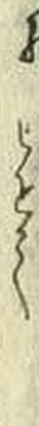被進之
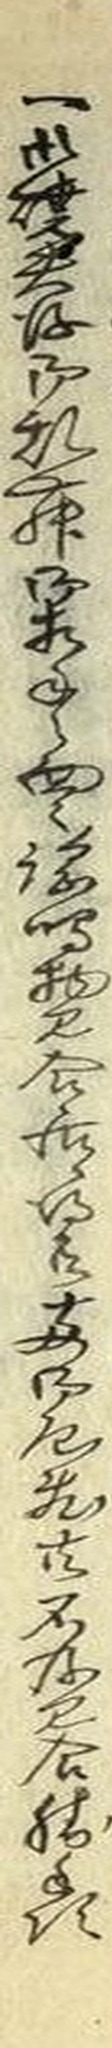一御焼失後御乱舞御相手之面々謡鳴物見合居候得共両御屋敷共不及見合勝手次
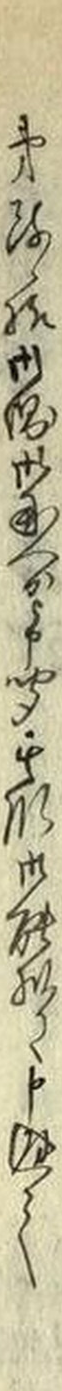第致候様御側御用人ゟ被申聞其段御能掛りへ申通之
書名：少傅日録抄（斉善付側向頭取日記、在府）
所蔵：福井県文書館 Fukui Prefectural Archives
